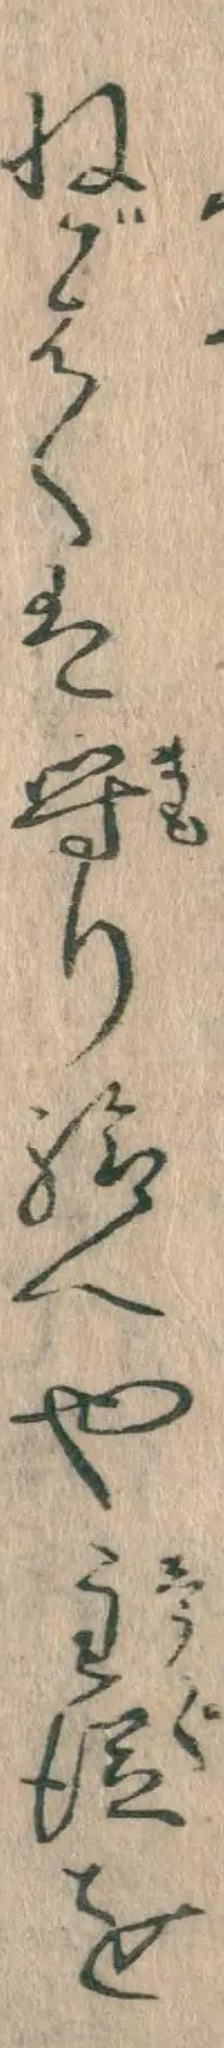ねがはくは守り給へや主従を
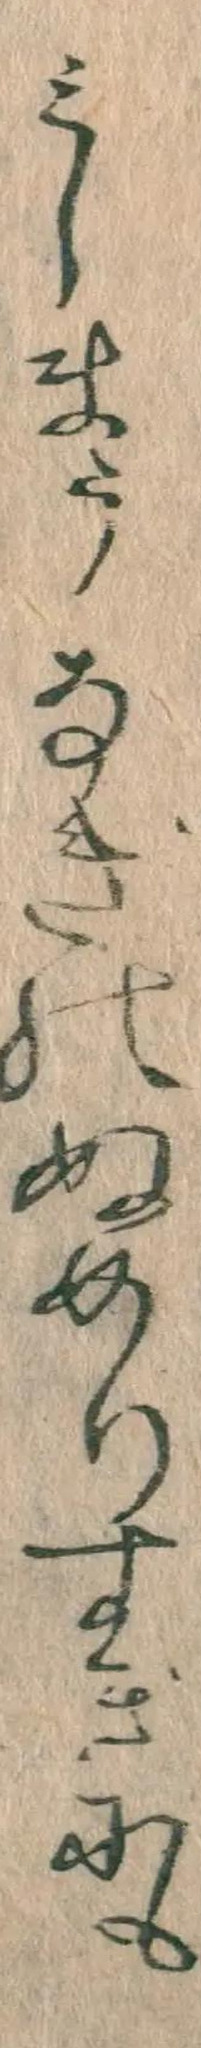みしまうなぎのぬめりすぎにも
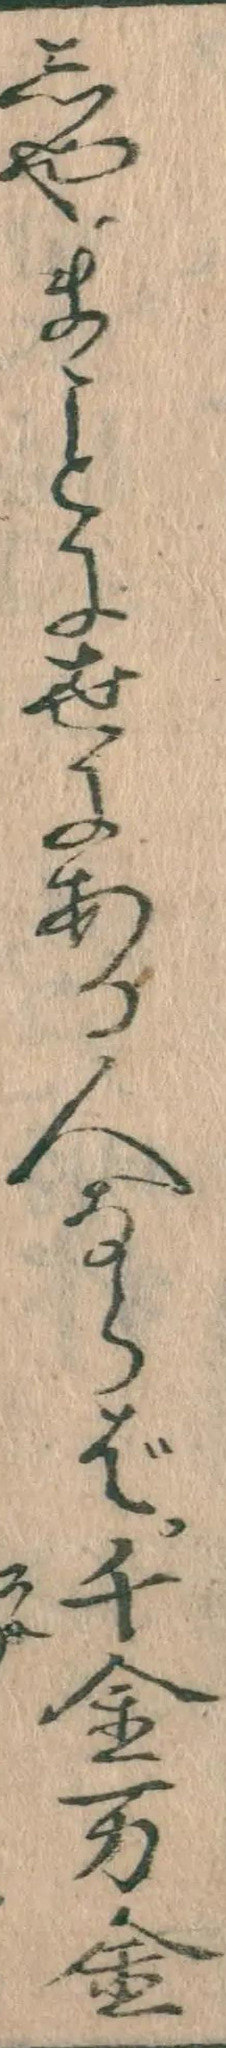志や。まことに世にある人ならば。千金万金
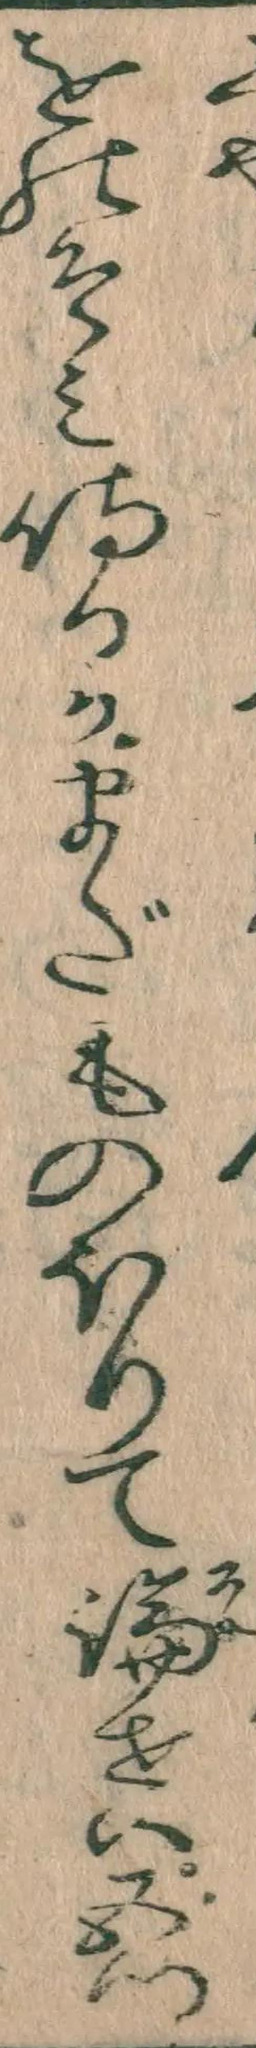をのそみ侍るか。まだものほりて論せは。五つ
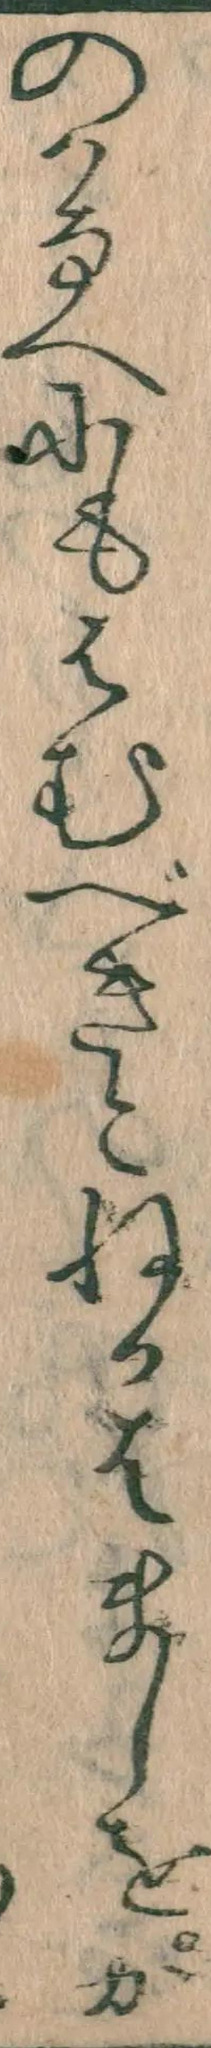のかなへにもはむべきとねかはましを。か
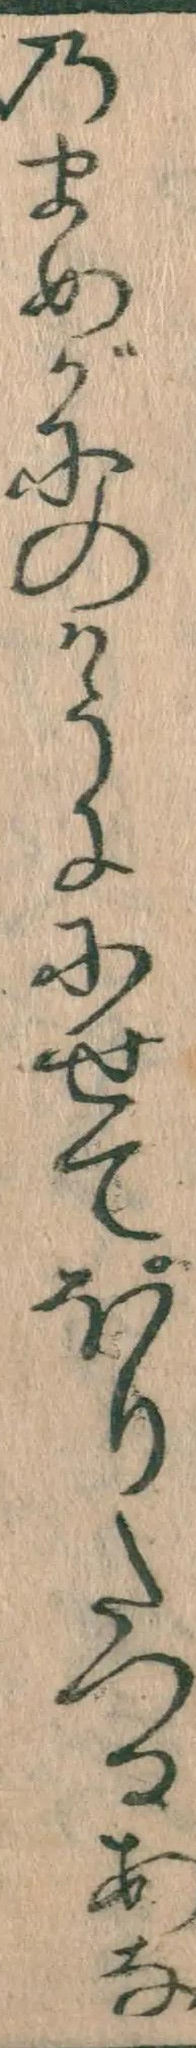のまめがにのかうににせて。ほりたつるあな
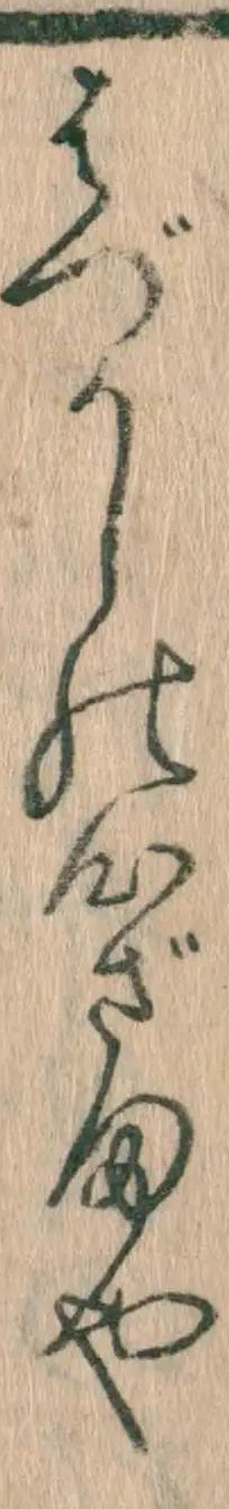はづかしの心ざまや

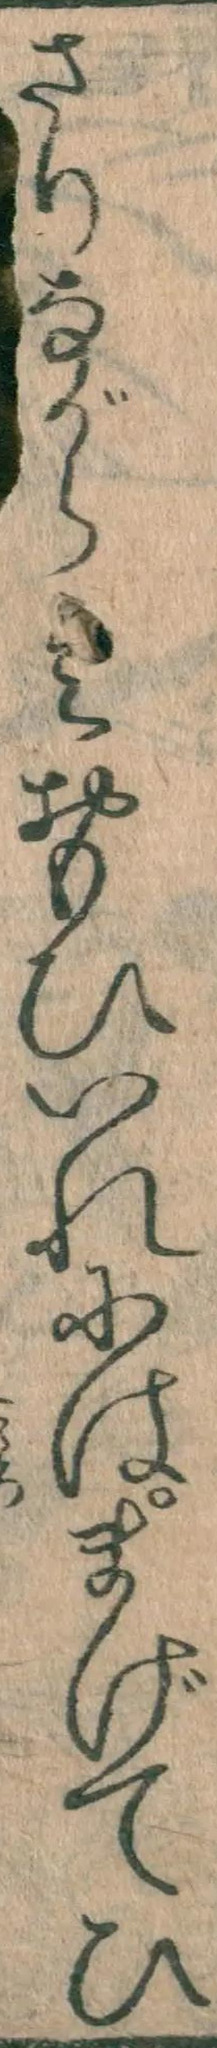さりながらおもひいれには。まげてひ
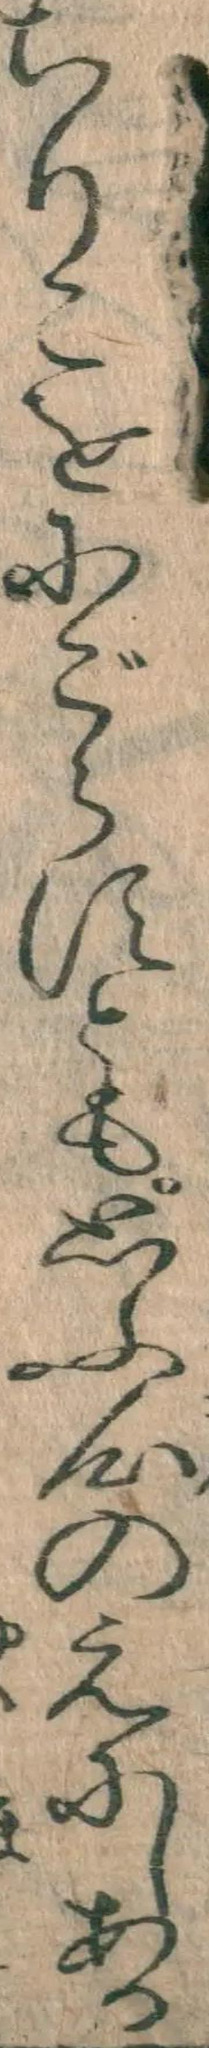ちりこをにごらすとも。思ふ心のえにしある
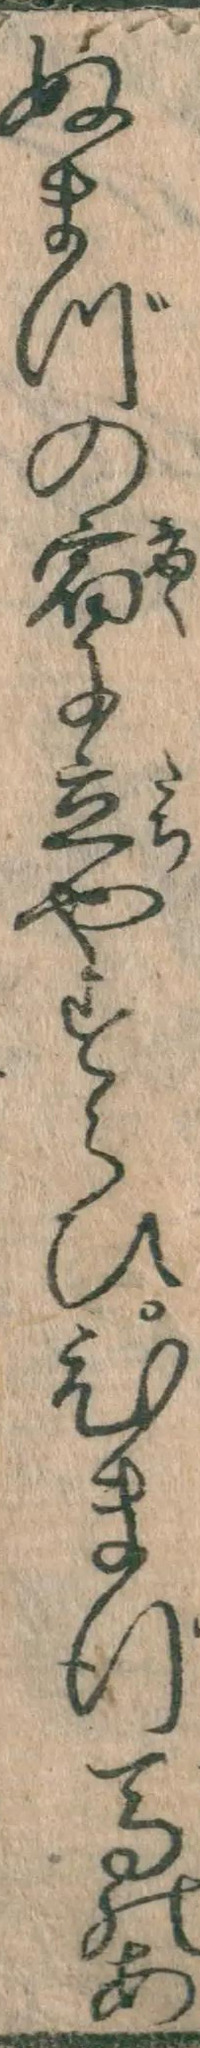ぬまづの宿に立やすらひ。ひま行馬のあ
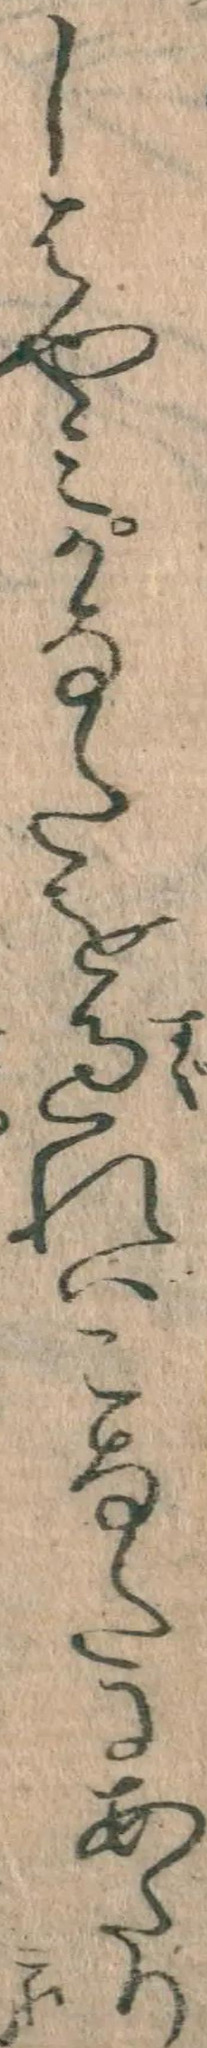しはやみ。かなたを過れはこなたにあたり
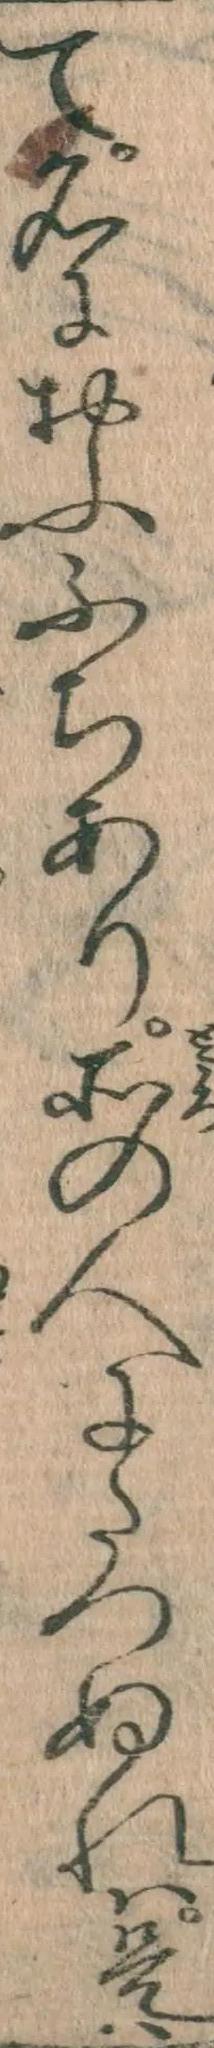て。名におふふちあり。所の人にたつぬれは。是は
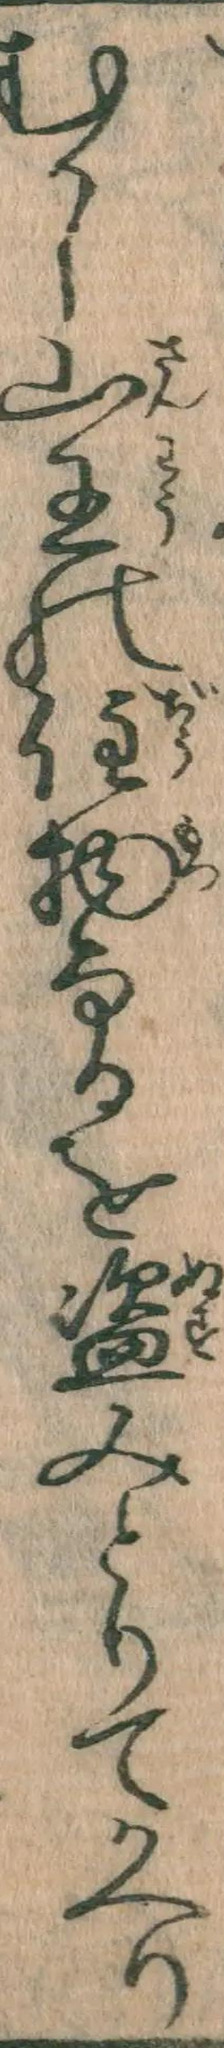むかし山王の住物なるを盗みとりてかへり
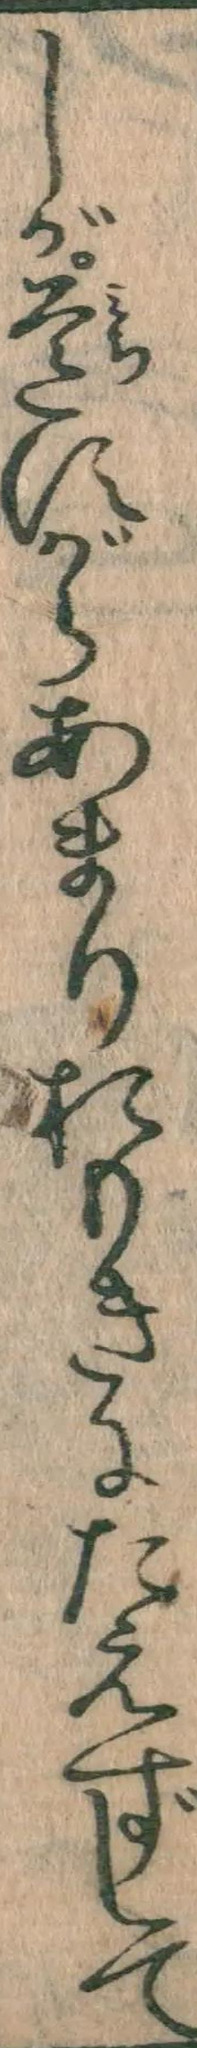しが。道すがらあまりおもきにたえずして
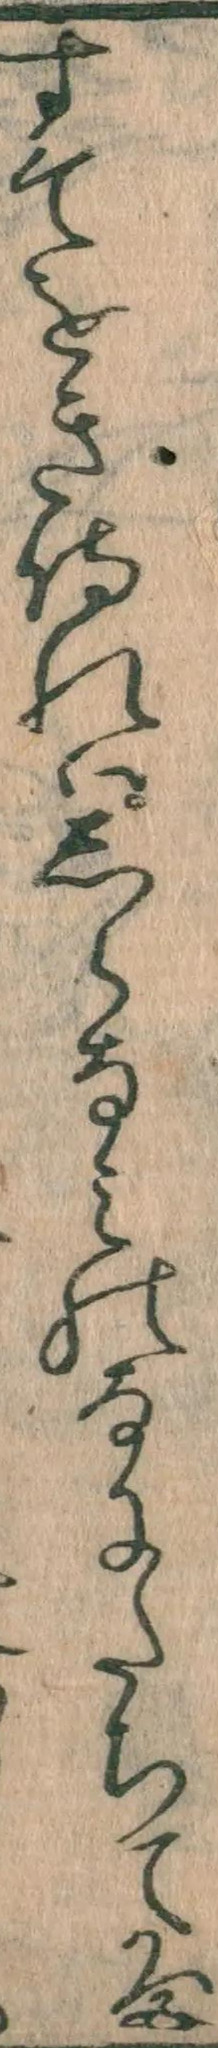すてをき侍れは。しらなみのなにたちてかま
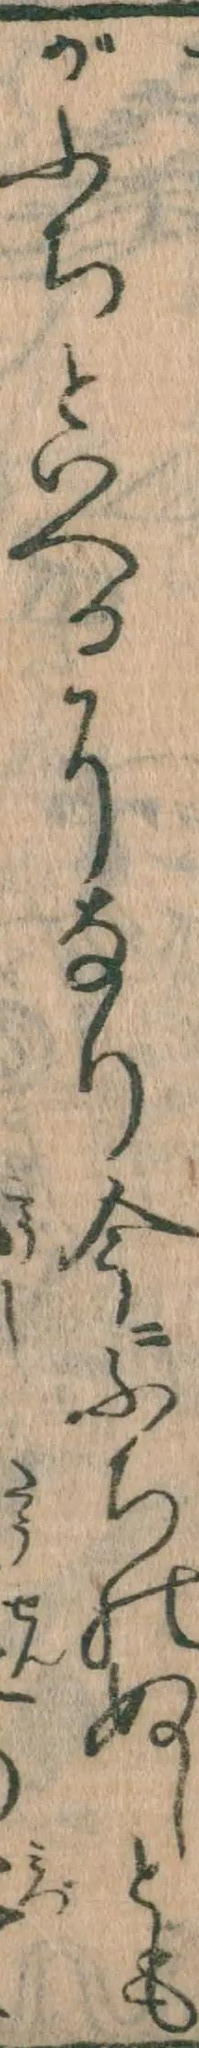がふちといへるになり今ふちのぬしとも
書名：竹斎狂歌物語 3巻
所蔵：国立国会図書館 National Diet Library, JAPAN
